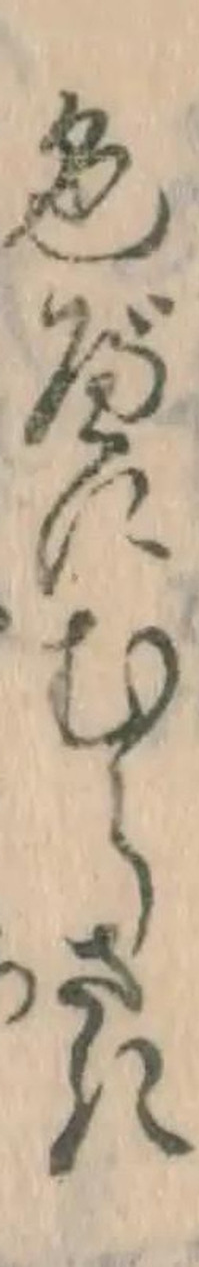色べにむらさき
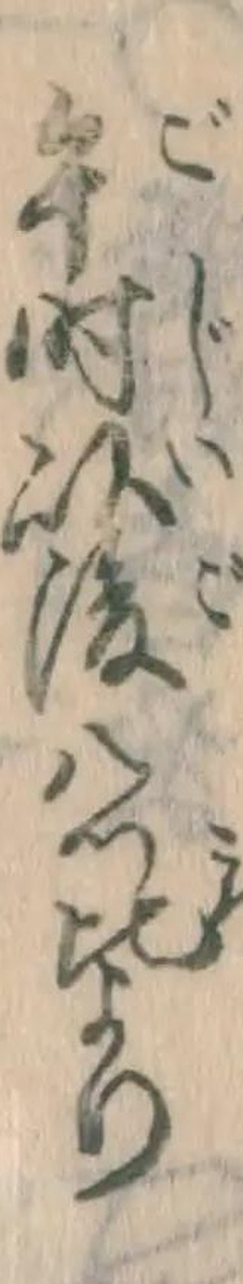午寺時以後八ツ比より
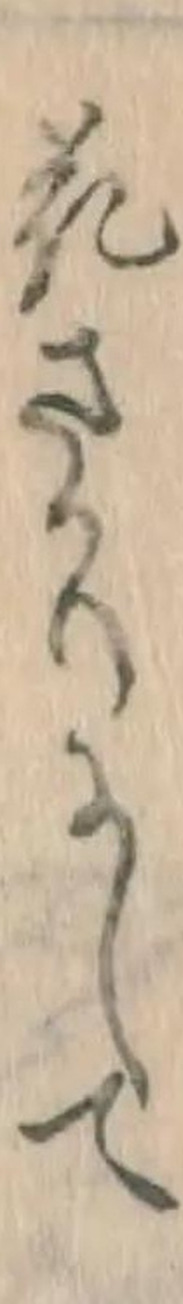花さかりにして
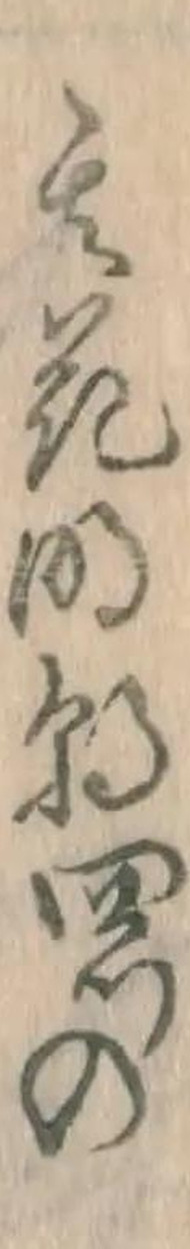其花明朝四ツの
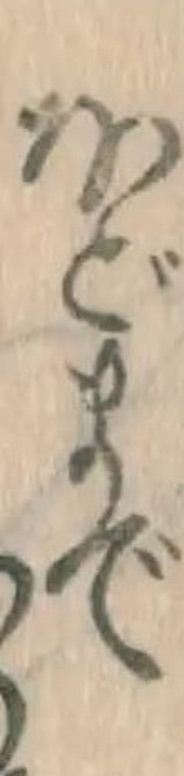ほどまで
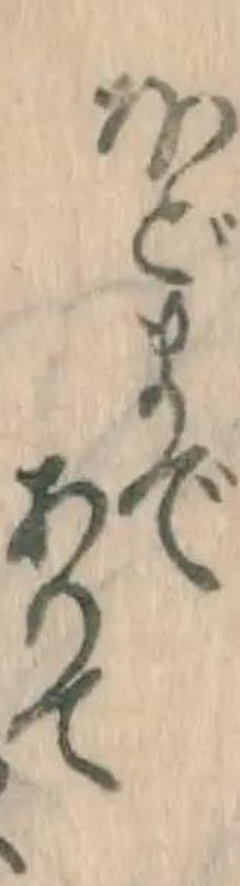ありて
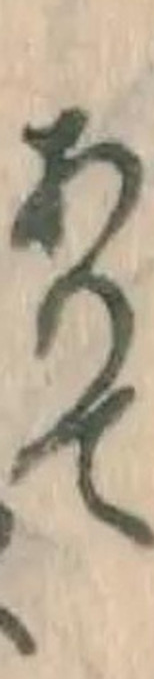ありて
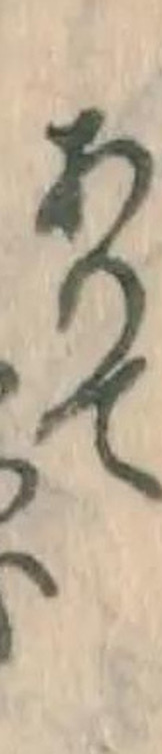ありて
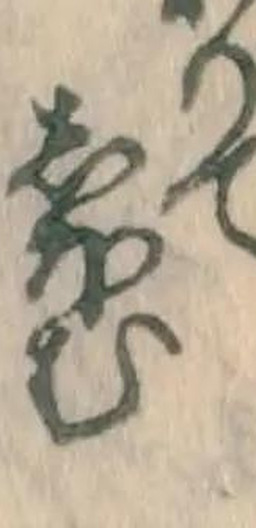しほむ
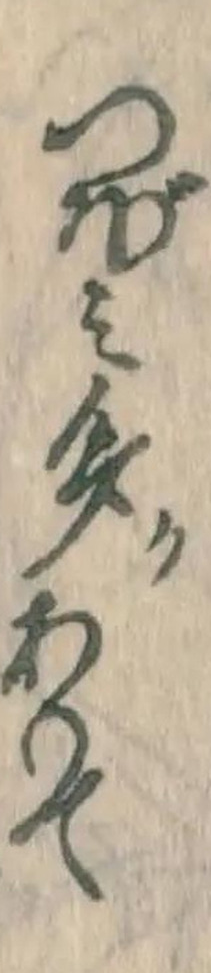つぼみ多くありて
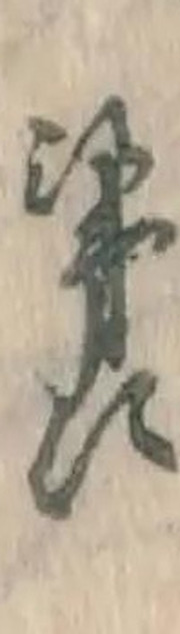次第に
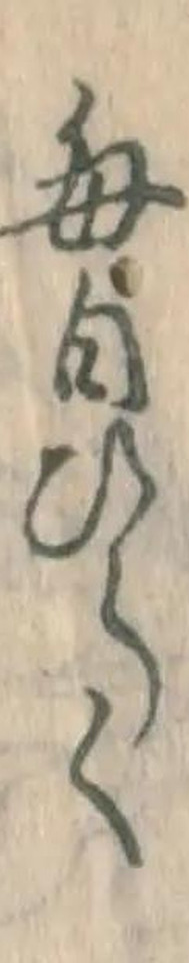毎日ひらく
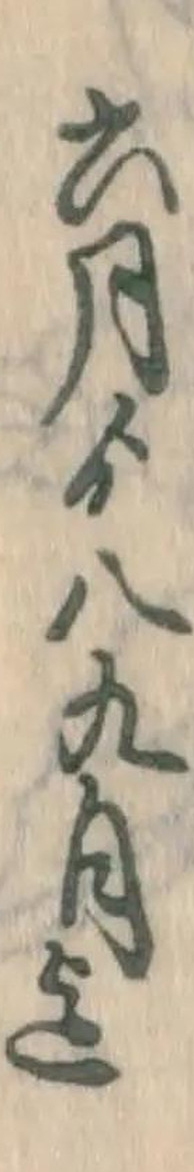六月ゟ八九月迄

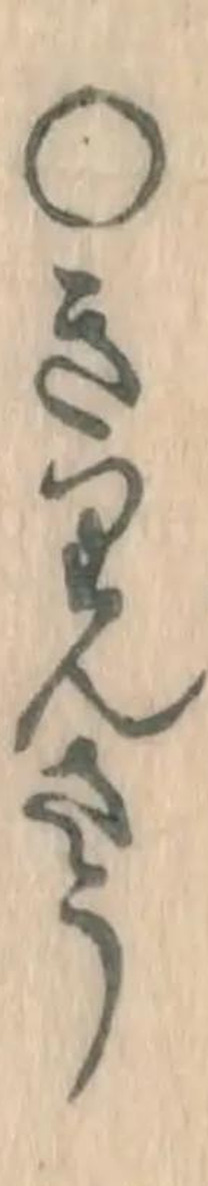〇きりんさう
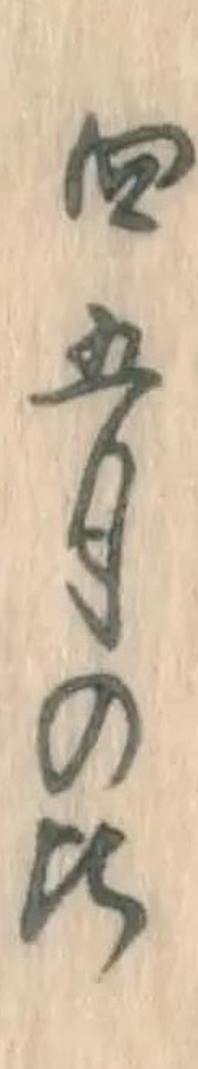四五月の比
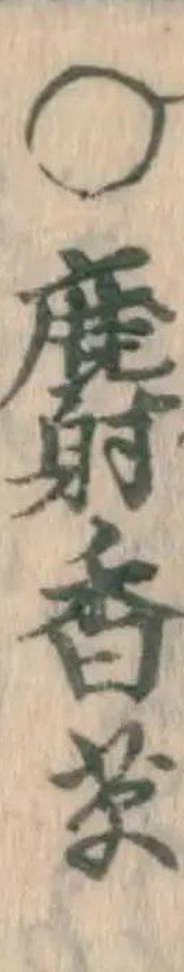〇麝香草
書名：艸花繪前集. [3]
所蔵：国立国会図書館 National Diet Library, JAPAN
